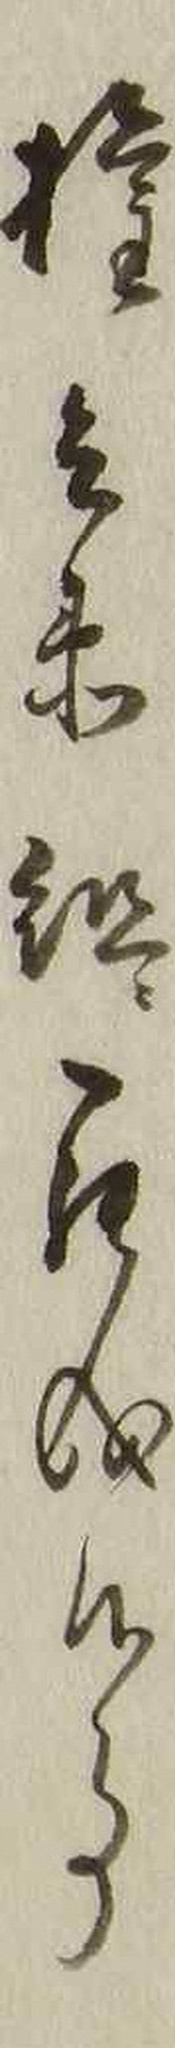権兵衛組に罷成候事
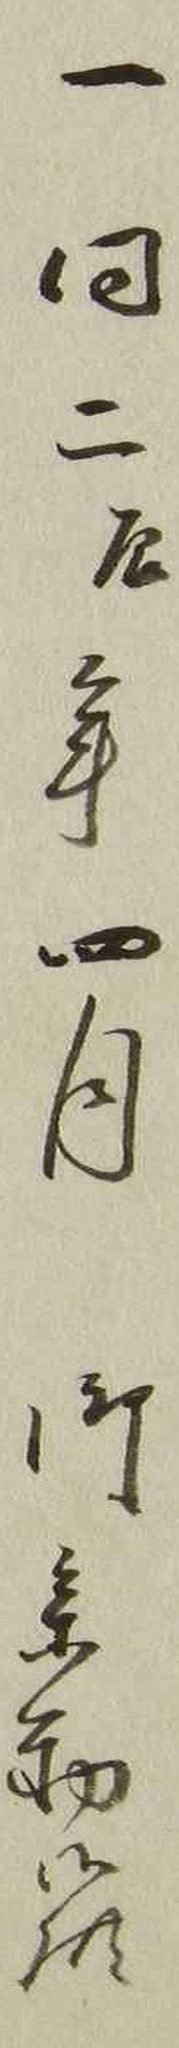一同二辰年四月御参勤御供
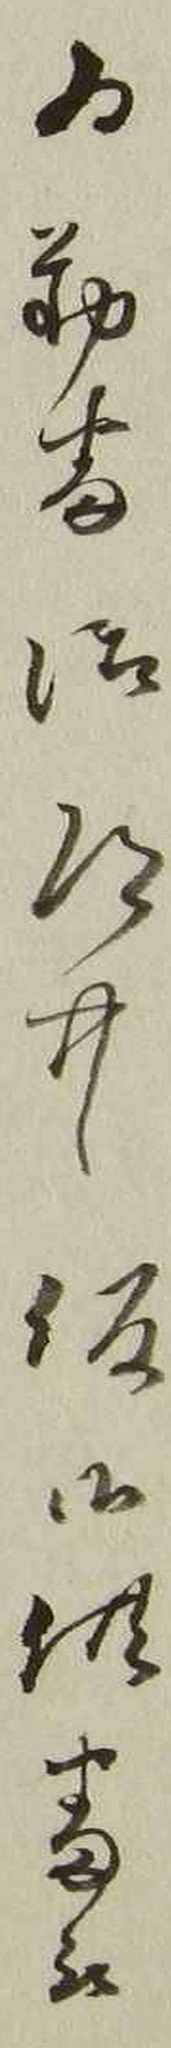為勤番御道中仮御供番被
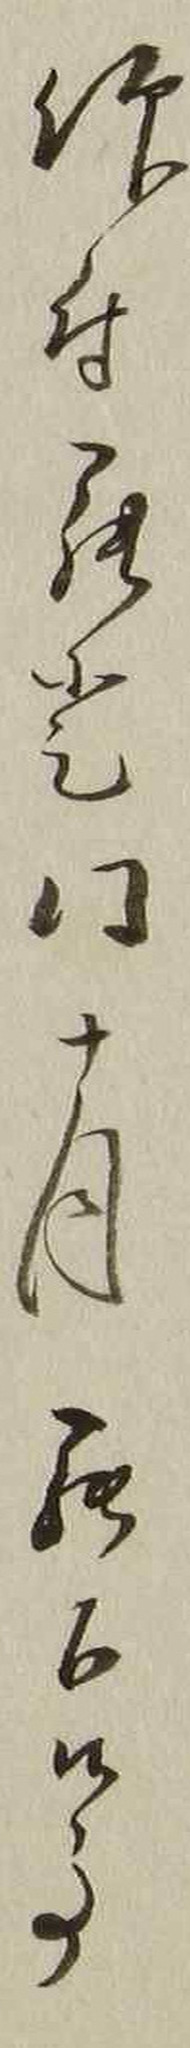仰付罷登同十月罷下候事
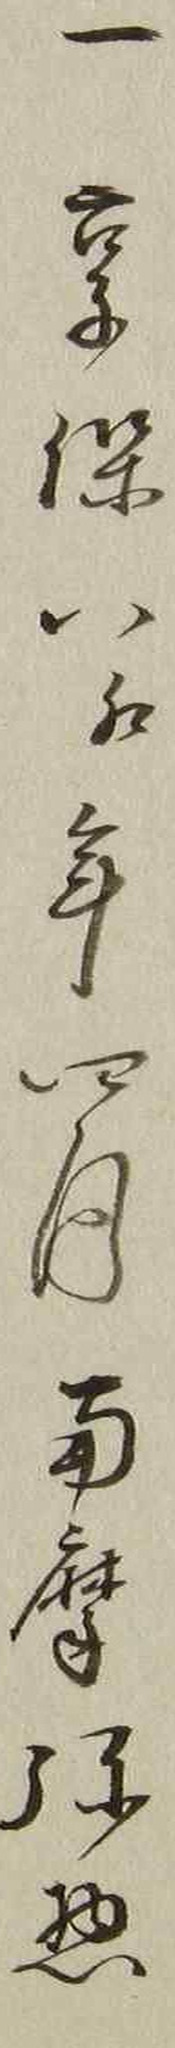一享保八卯年四月南摩弥惣
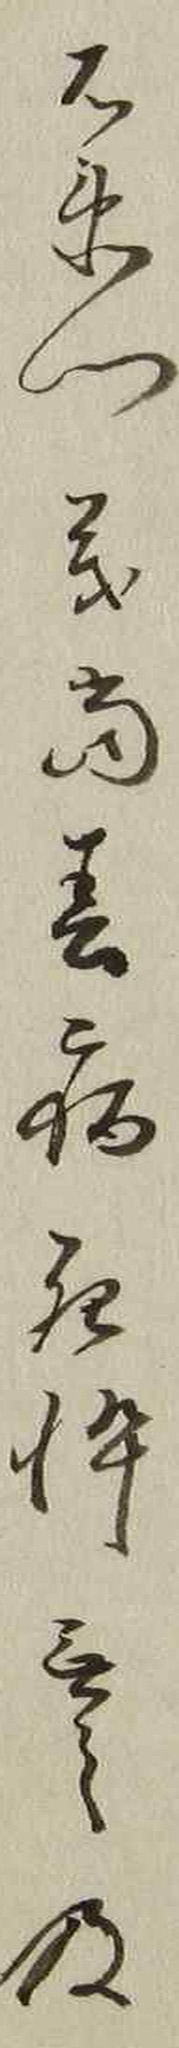右衛門義当春病死忰無之及
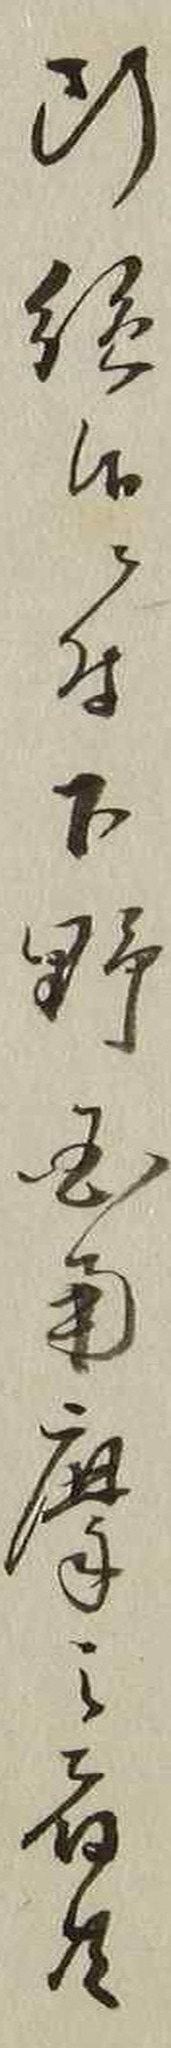断絶候に付下野国南摩之者共
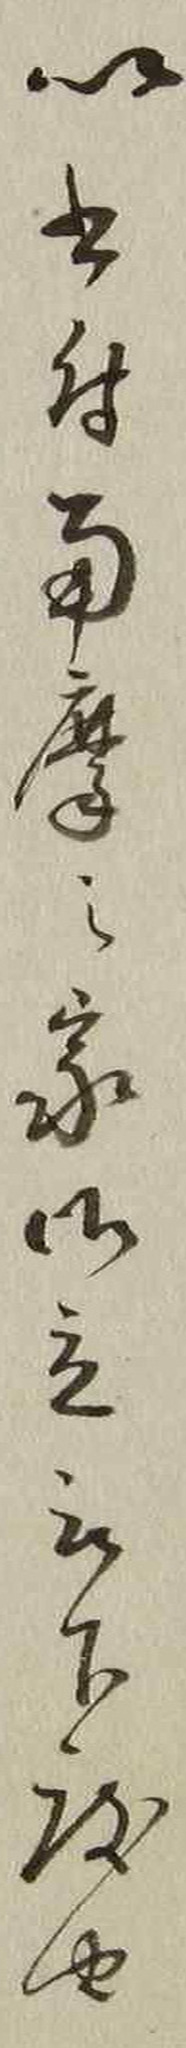以書付南摩之家御立被下度由
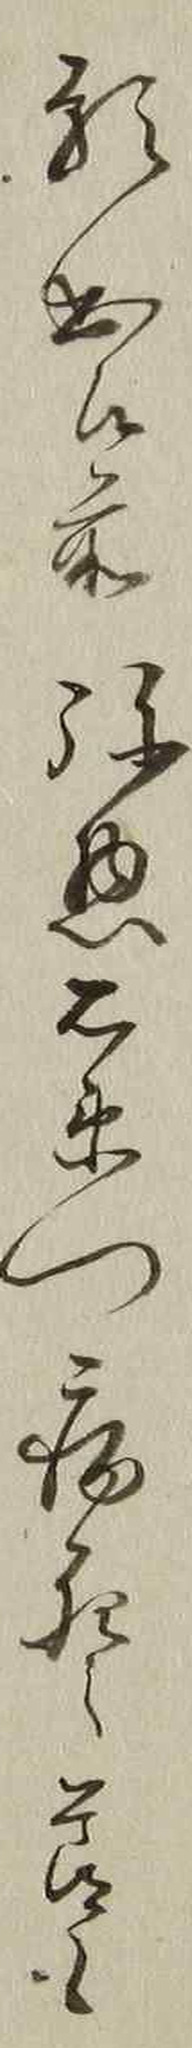願出候所弥惣右衛門病死之節も
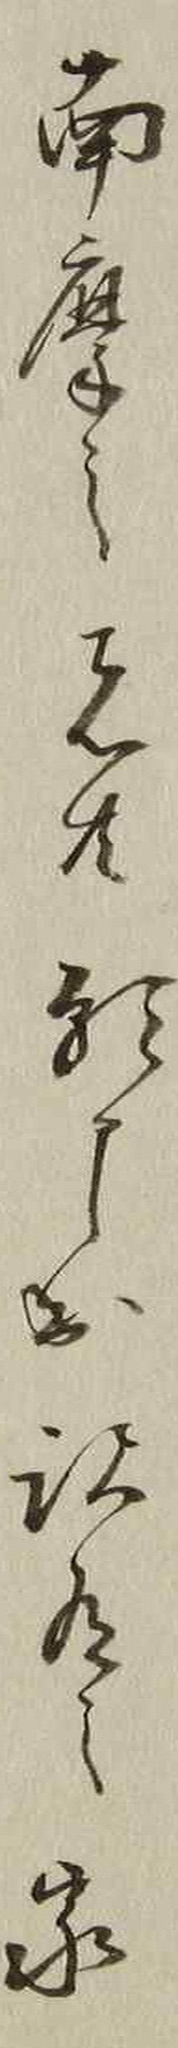南摩之者共願申出訳有之家
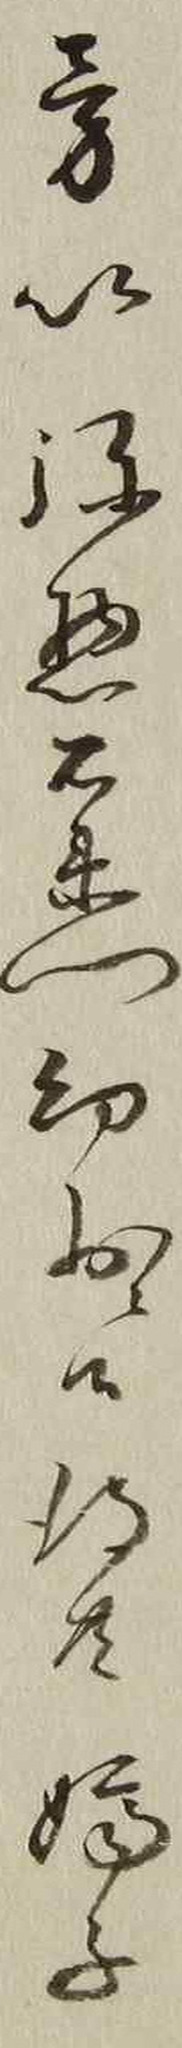旁以弥惣右衛門幼少に候得共嫡子
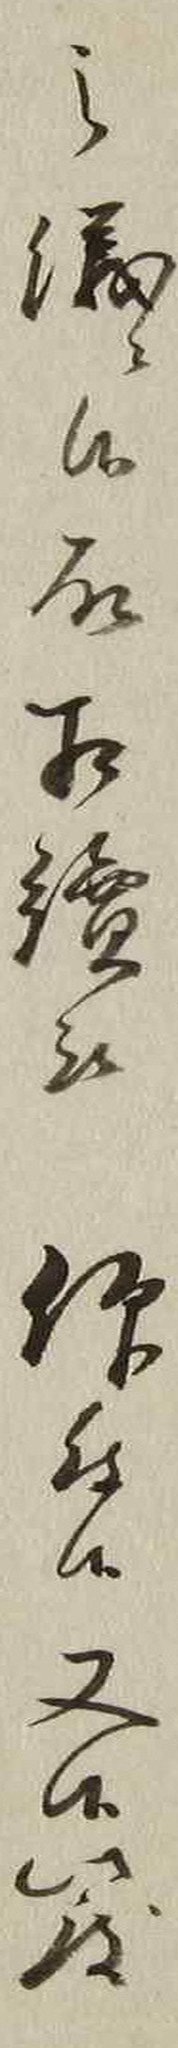之義に候故相続被仰付候又候此度
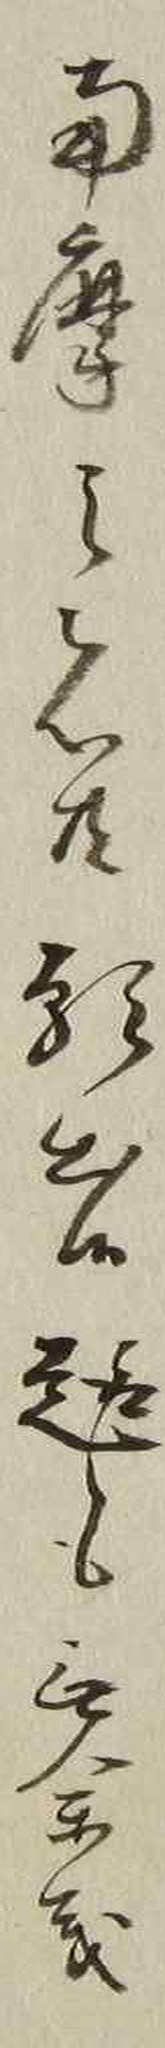南摩之者共願出候趣も無余義
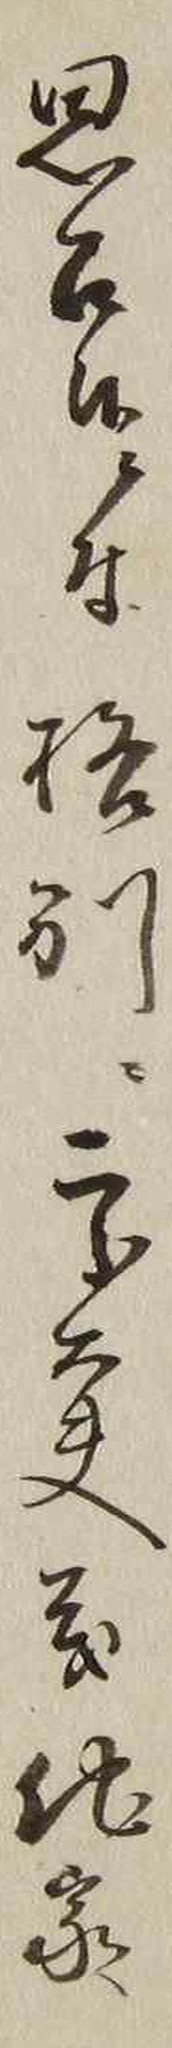思召候に付格別に二郎太夫義他家
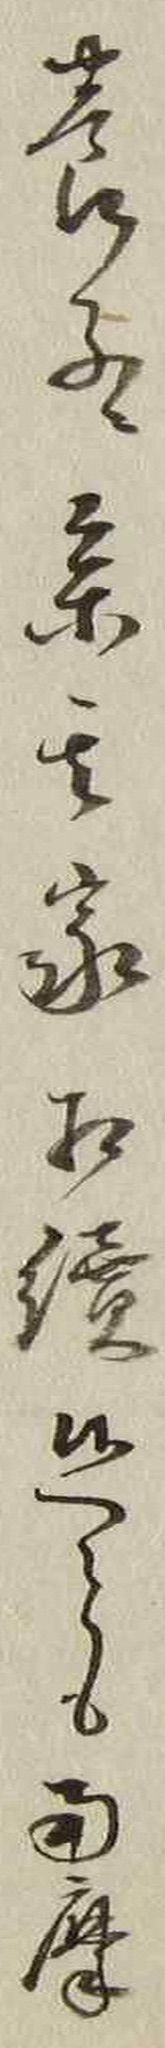養子に参其家相続候へとも南摩
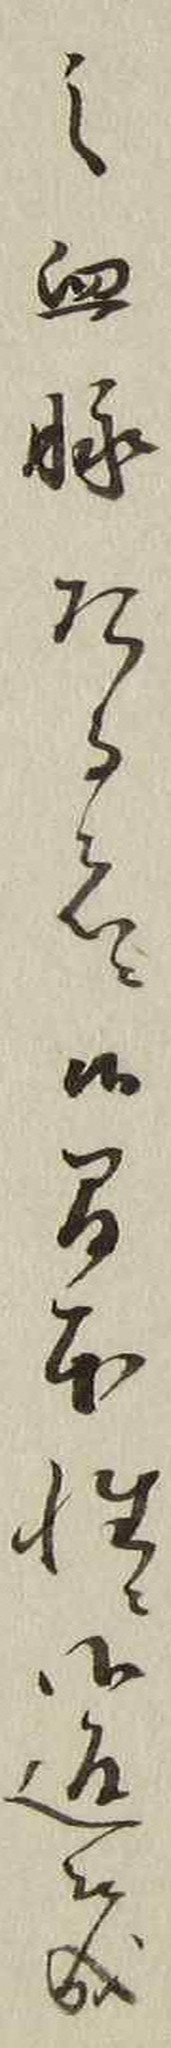之血脈たる者に候間本性に御返被成
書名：諸士系譜　巻之159　な之部1
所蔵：会津若松市立会津図書館
